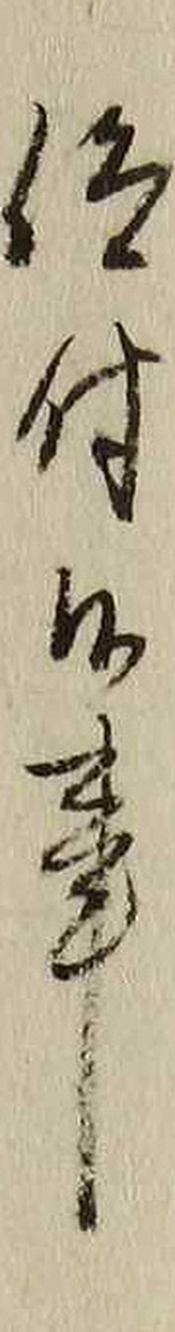仰付候事
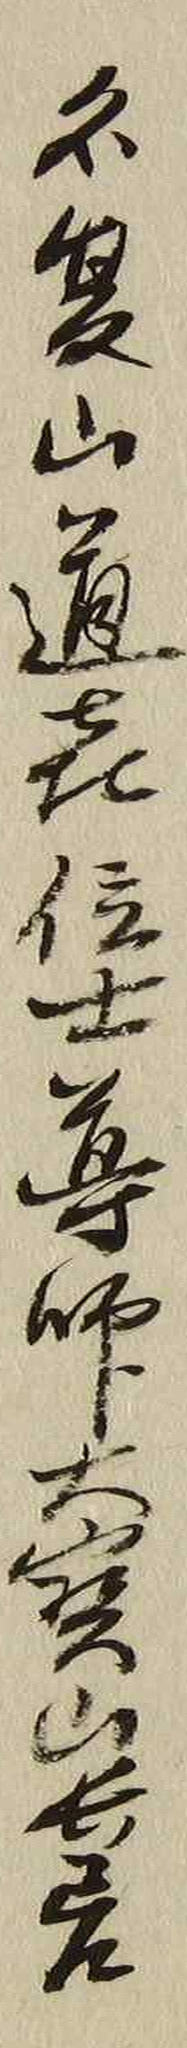名夏山道喜信士導師大宝山長善
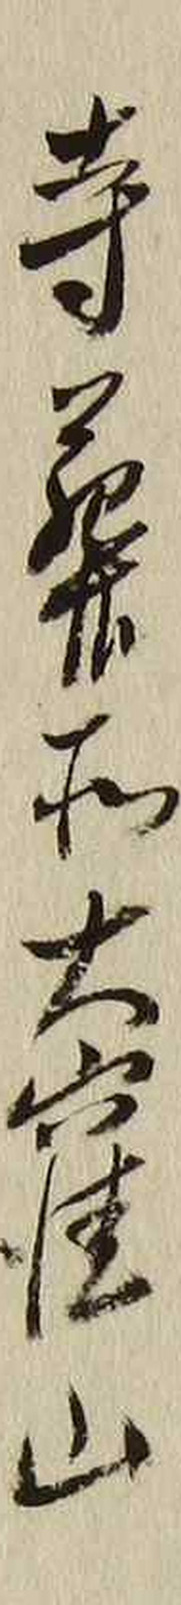寺葬所大窪山
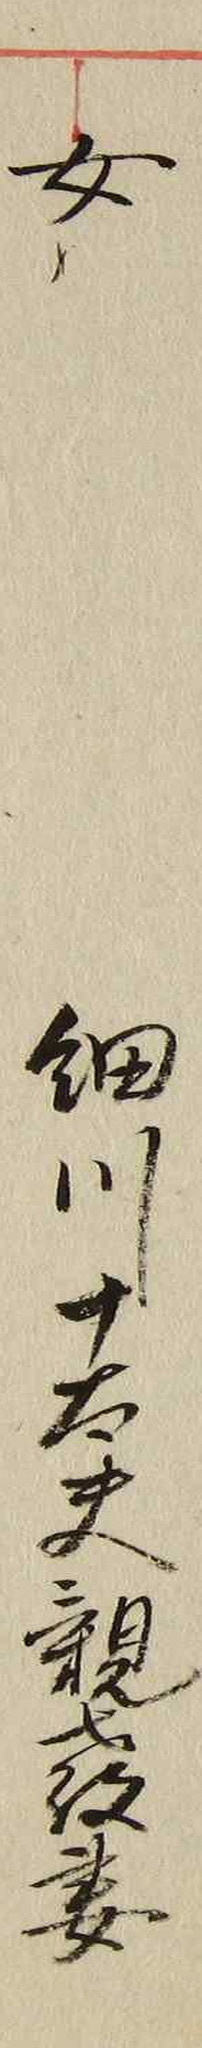女細川十太夫親教妻
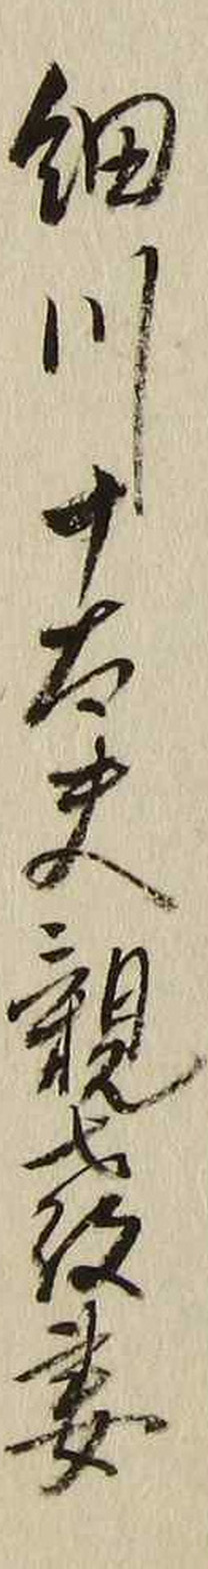女細川十太夫親教妻
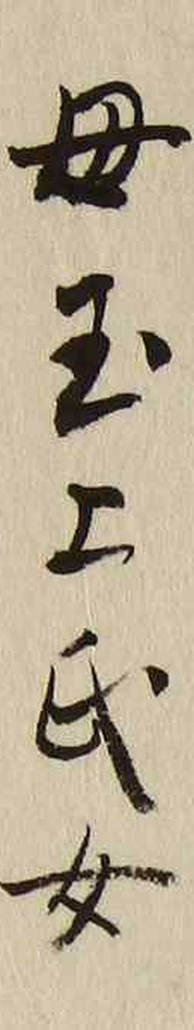母玉上氏女

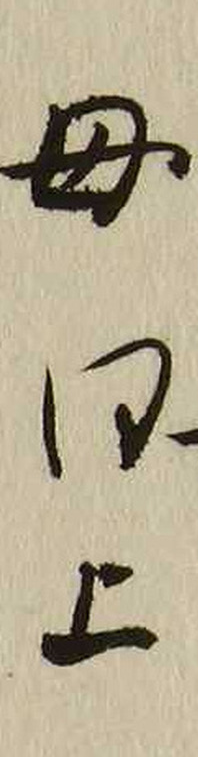母同上
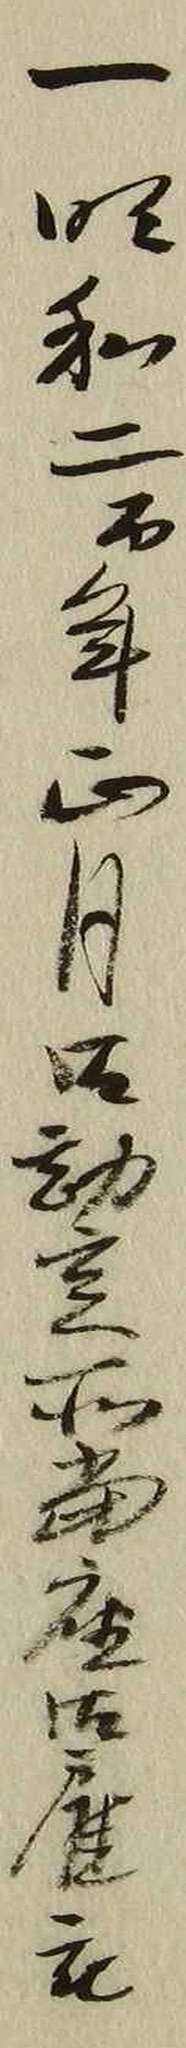一明和二酉年正月御勘定所当座御雇被
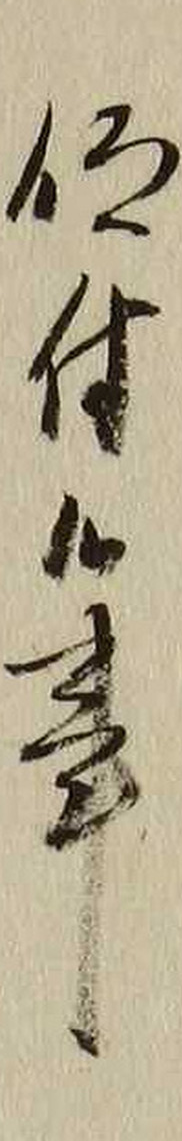仰付候事
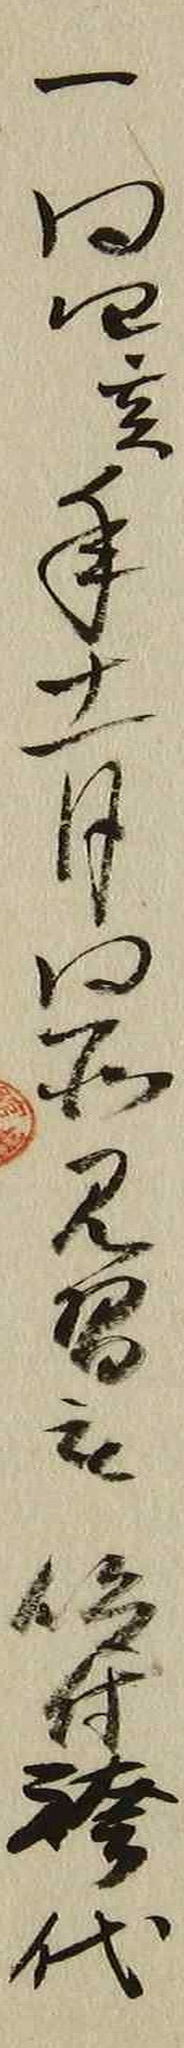一同四亥年十一月同所見習被仰付袴代
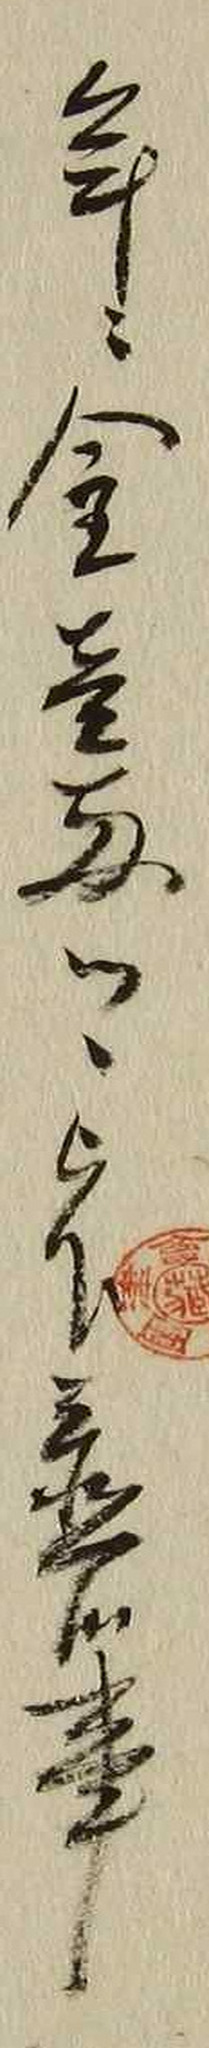年金壱両ツヽ被下置候事
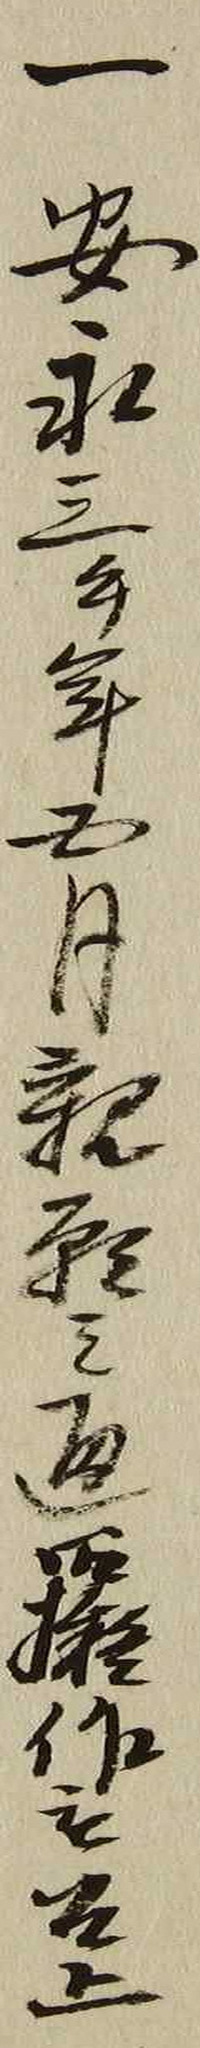一安永三午年五月親願之御擬作被召上
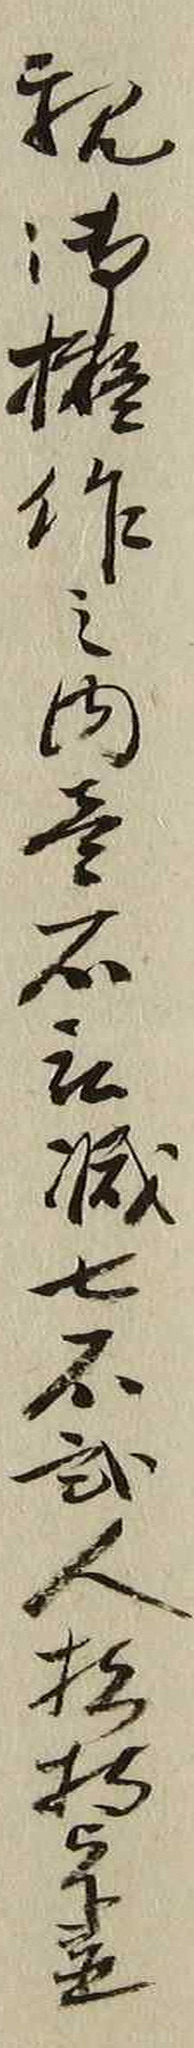親御擬作之内壱石被減七石弐人扶持被下置
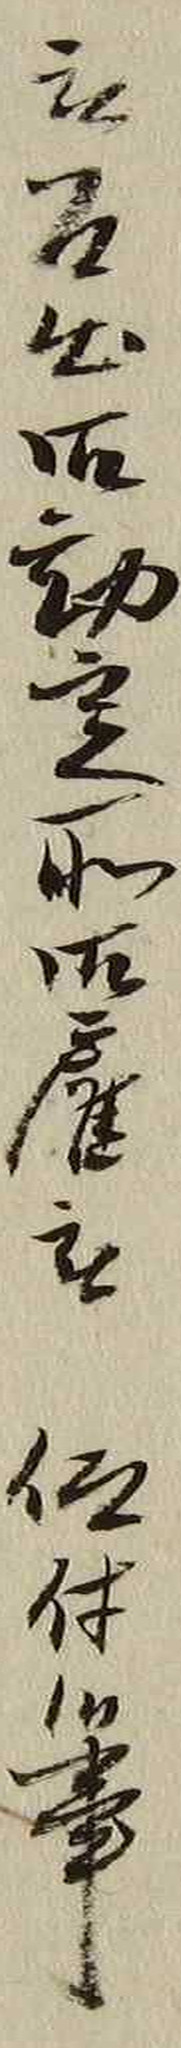被召出御勘定所御雇被仰付候事
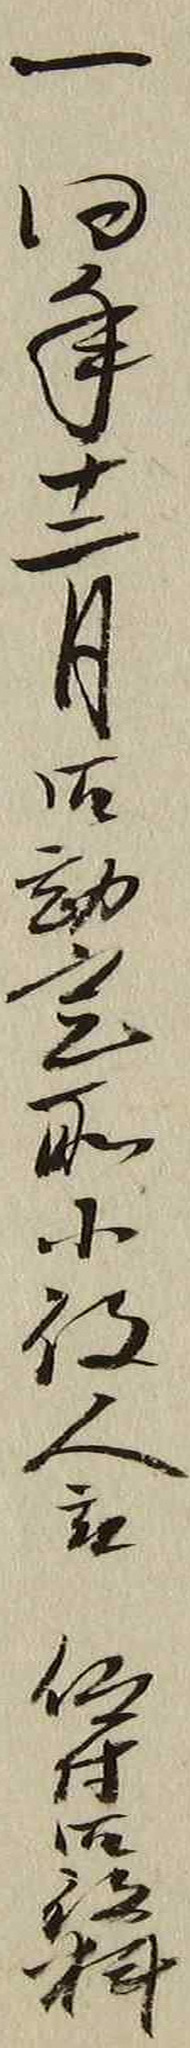一同年十二月御勘定所小役人被仰付御役料
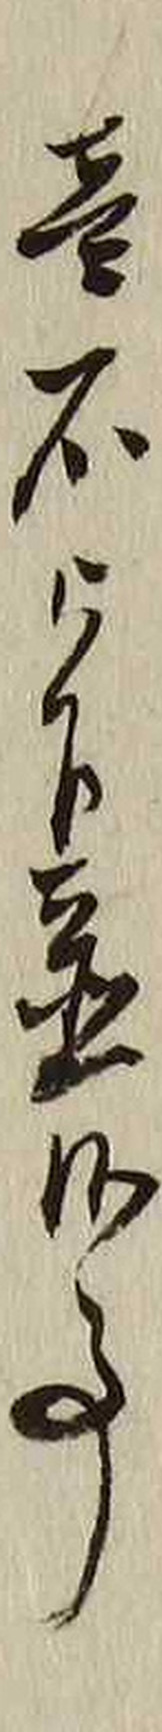壱石被下置候事
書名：諸士系譜　巻之350　せ之部1冊全
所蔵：会津若松市立会津図書館
